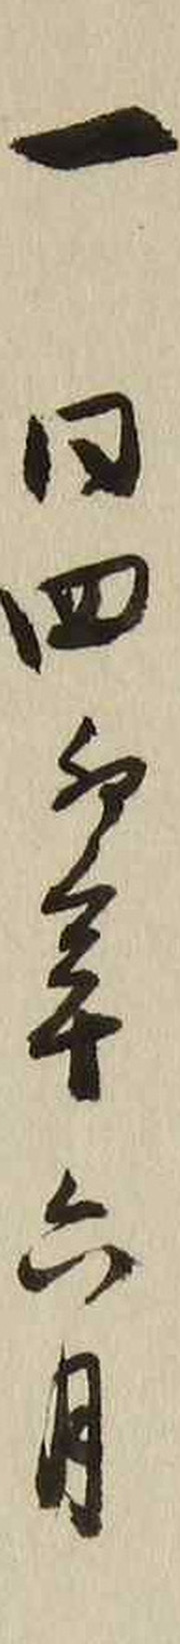一同四卯年六月
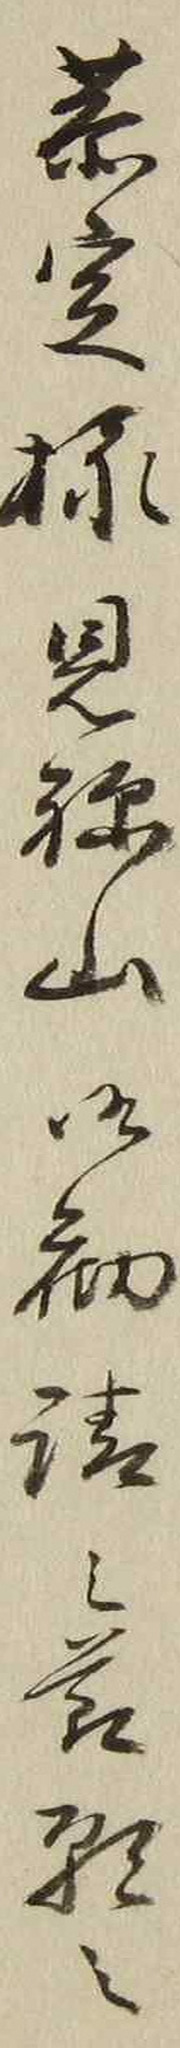恭定様見祢山御勧請之節願之
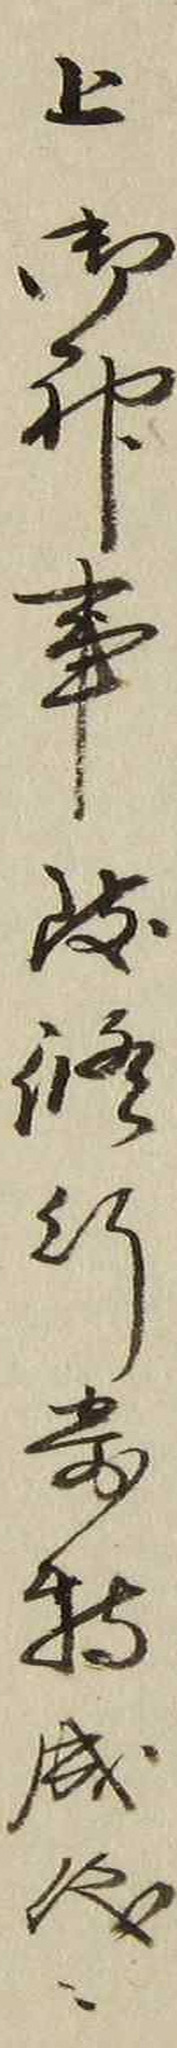上御神事致修行奇特成儀ニ
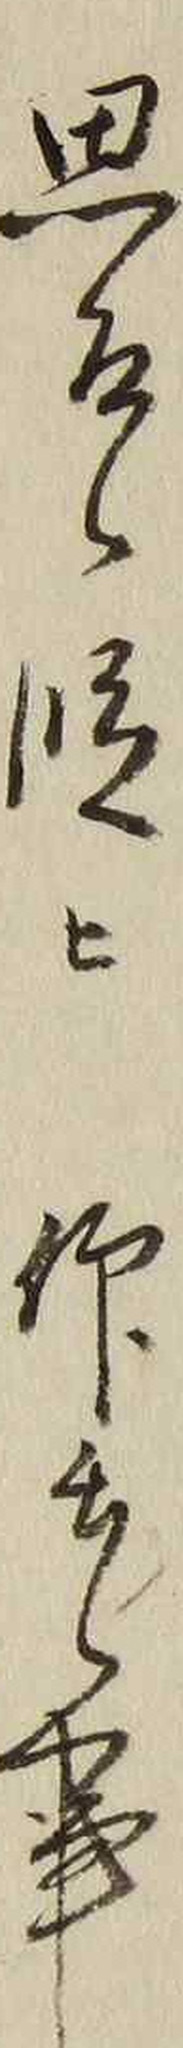思召候段被仰出候事
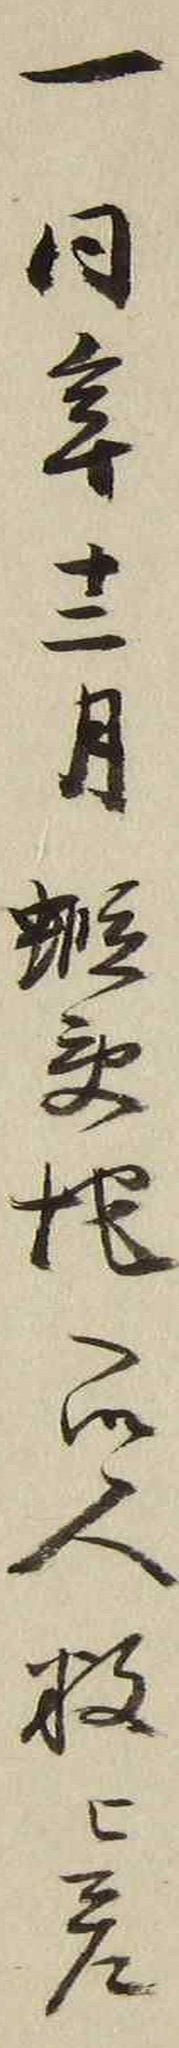一同年十二月蝦夷地へ御人数被差
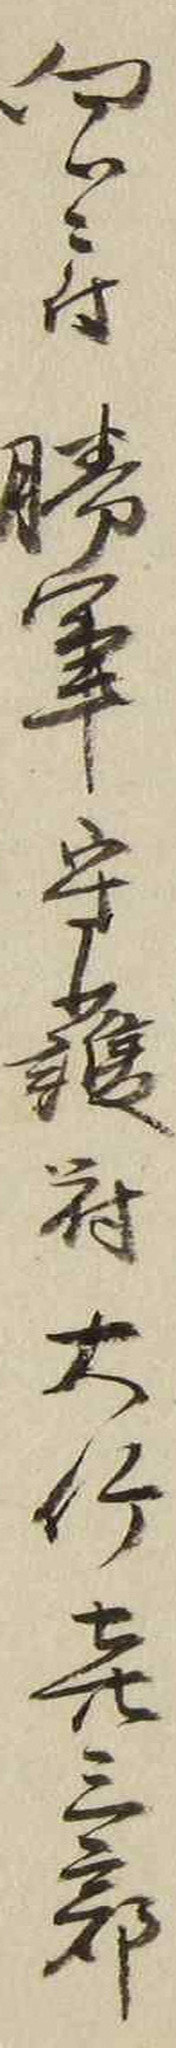向候ニ付勝軍守護府大竹喜三郎
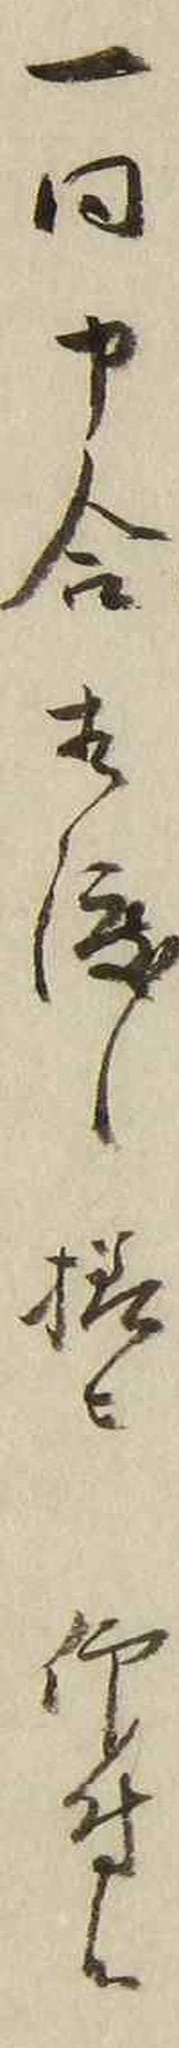一同申合相渡候様被仰付候

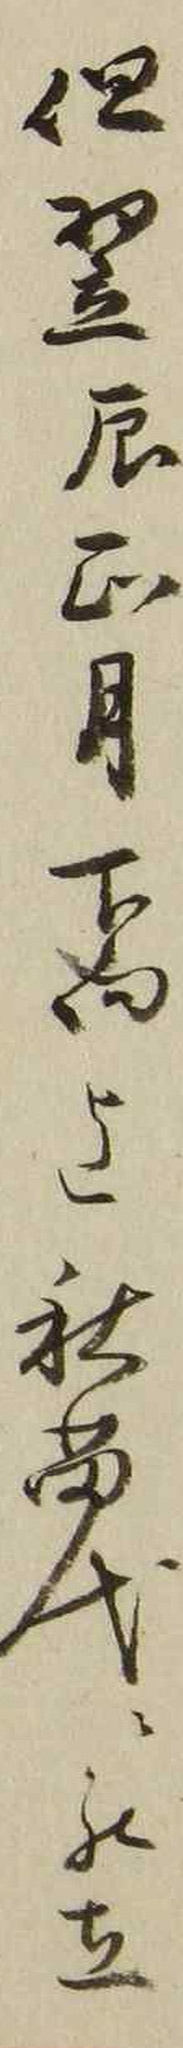但翌辰正月下向迄秋苗代ニ罷在
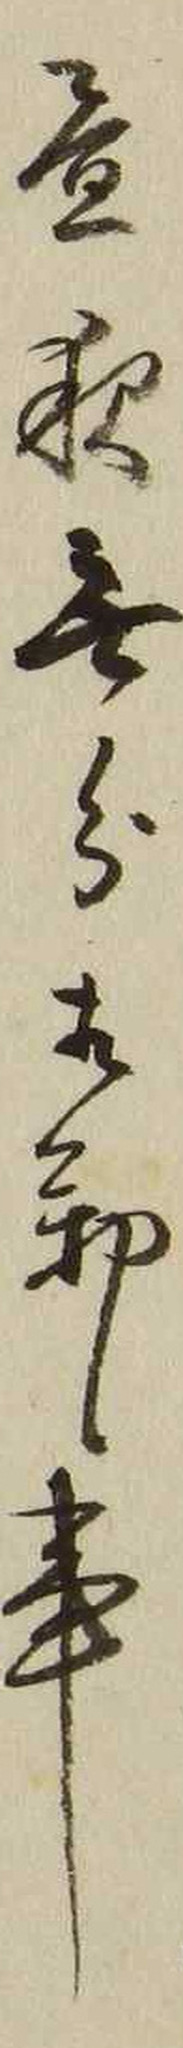昼夜無分相勤候事
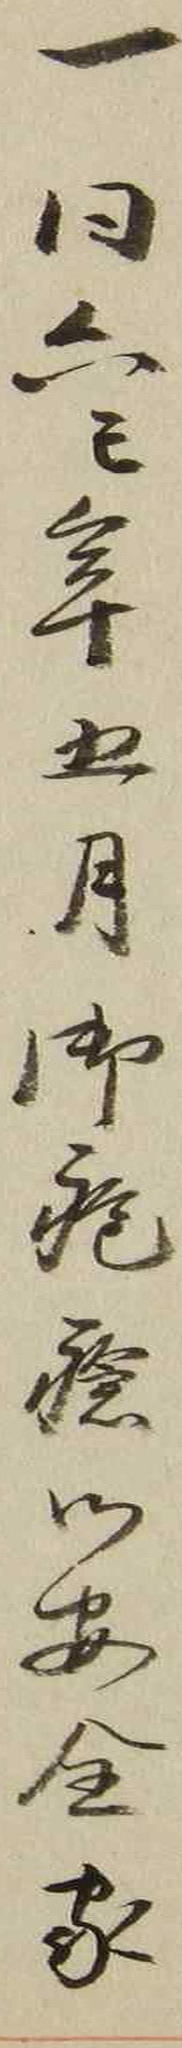一同六巳年五月御疱瘡御安全家
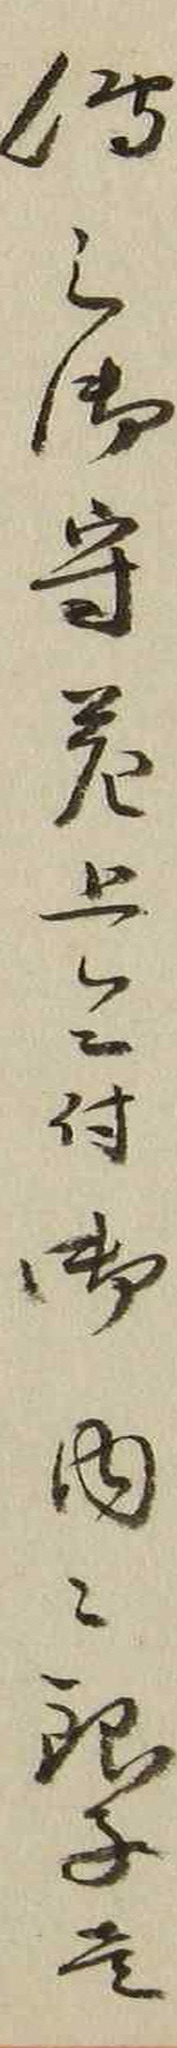伝之御守差上候ニ付御内ニ銀子壱
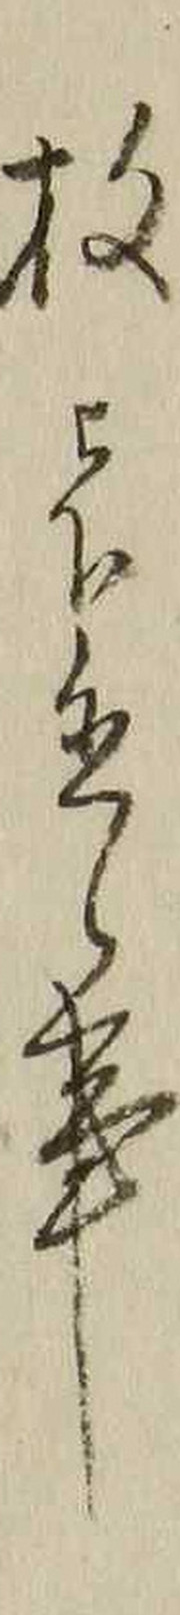枚被下置候事
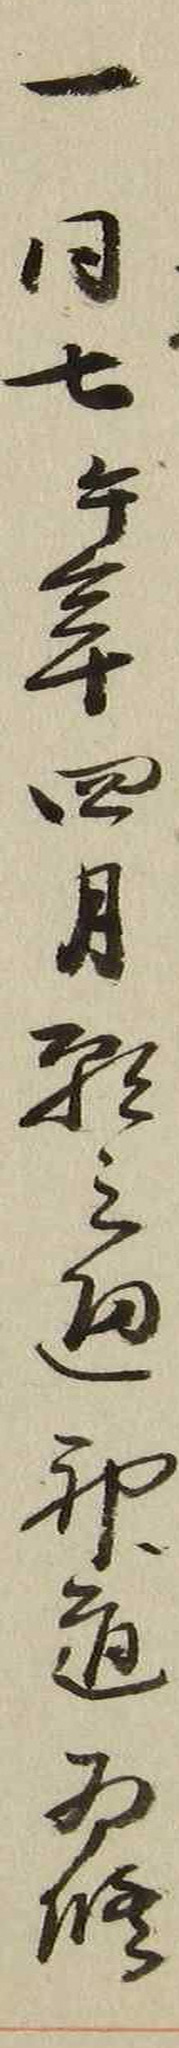一同七午年四月願之通神道為修
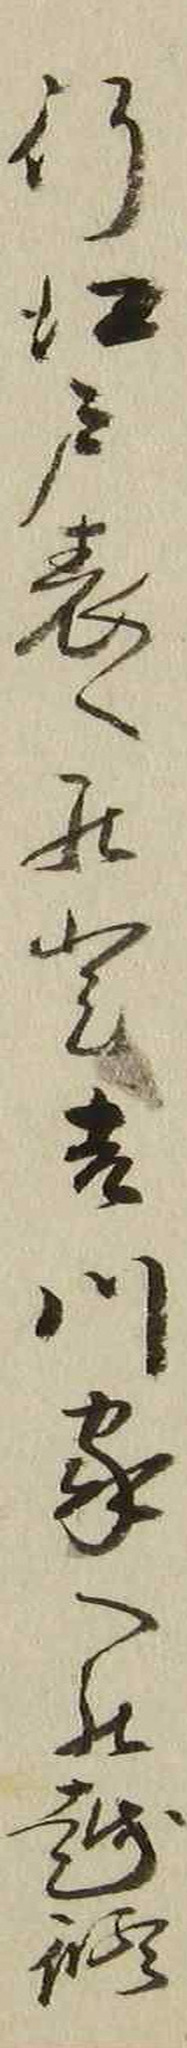行江戸表へ罷登吉川家へ罷越修
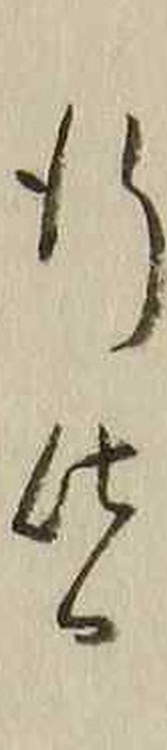行仕候
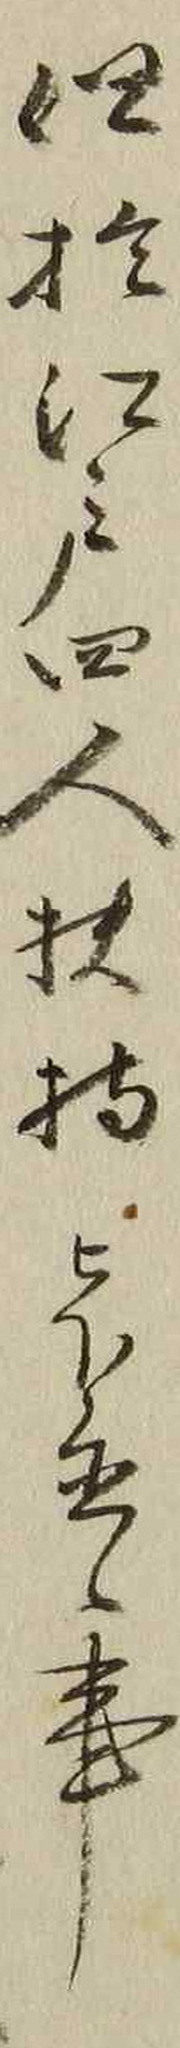但於江戸四人扶持被下置候事
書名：諸士系譜　巻之291　さ之部23
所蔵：会津若松市立会津図書館
